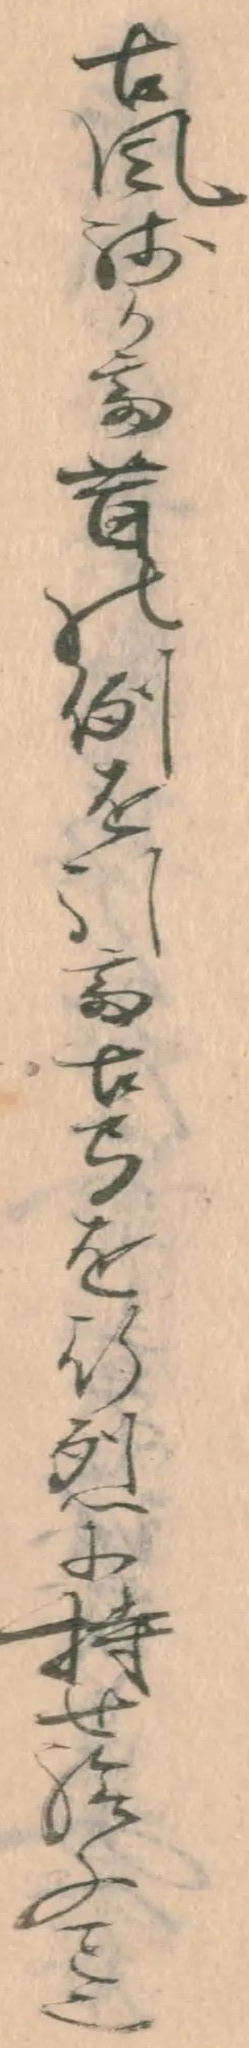古風残りて昔の例を引て古弓を行列に持せ給ふこと也
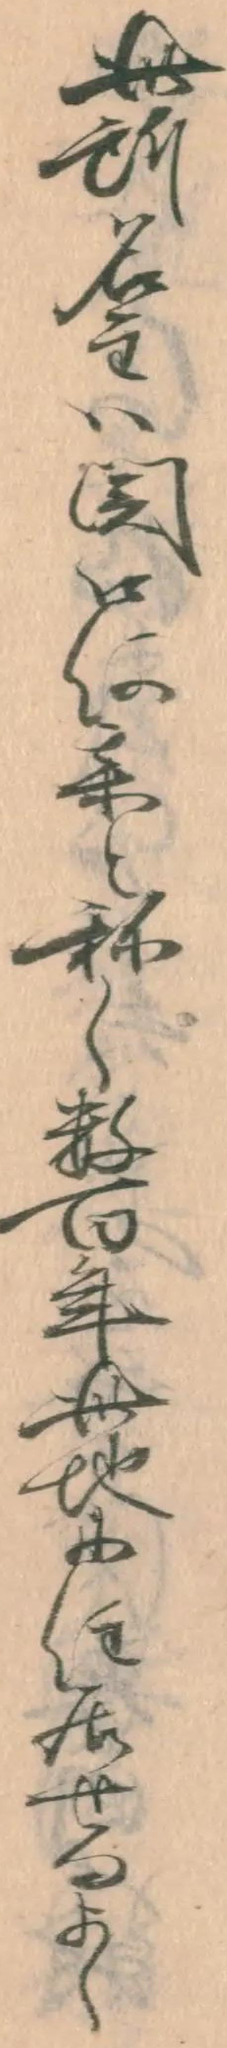此所名主は関口何某と称し数百年此地に住居せるよし
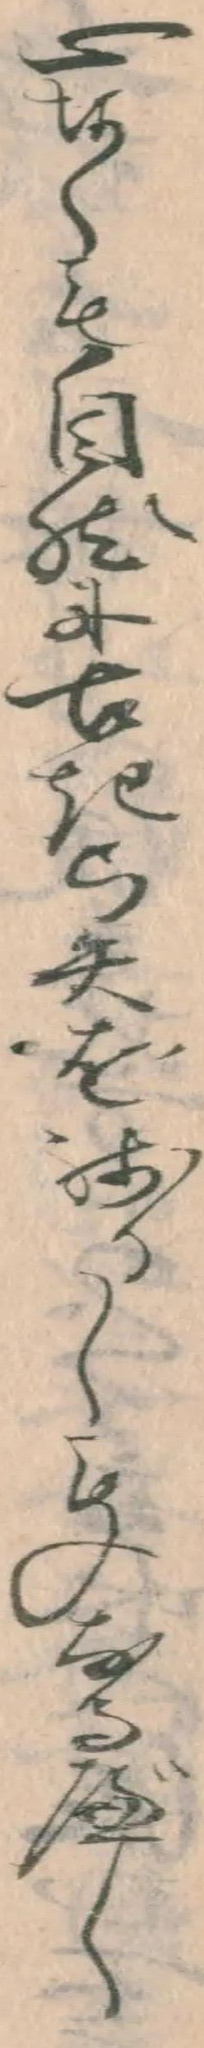心なくも自然に古き弓矢を残りしものなるべし
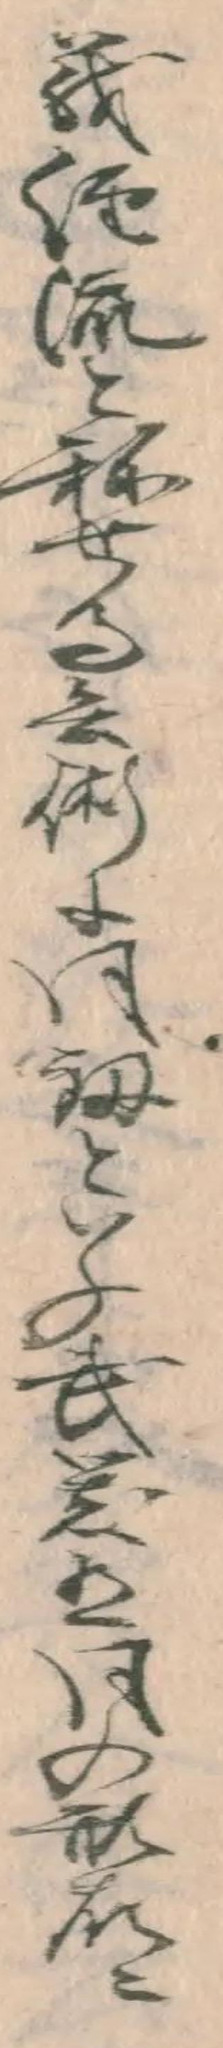義経流と称せる兵術に月剣といふ武器有月の形故に
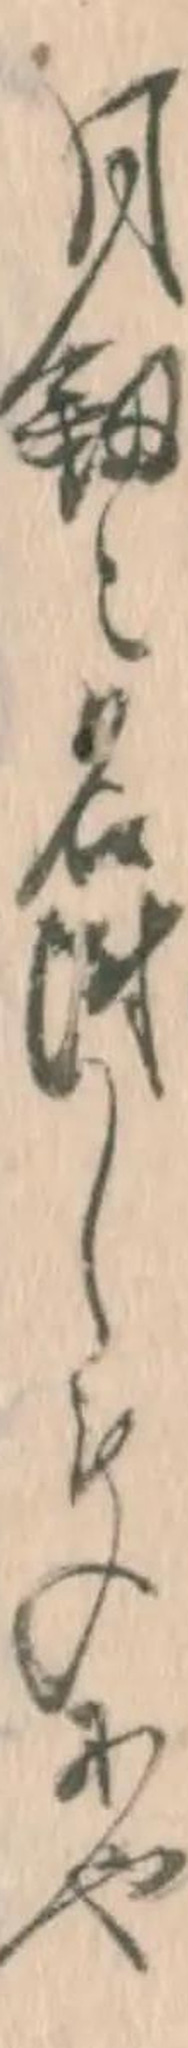月釼と名附しものにや
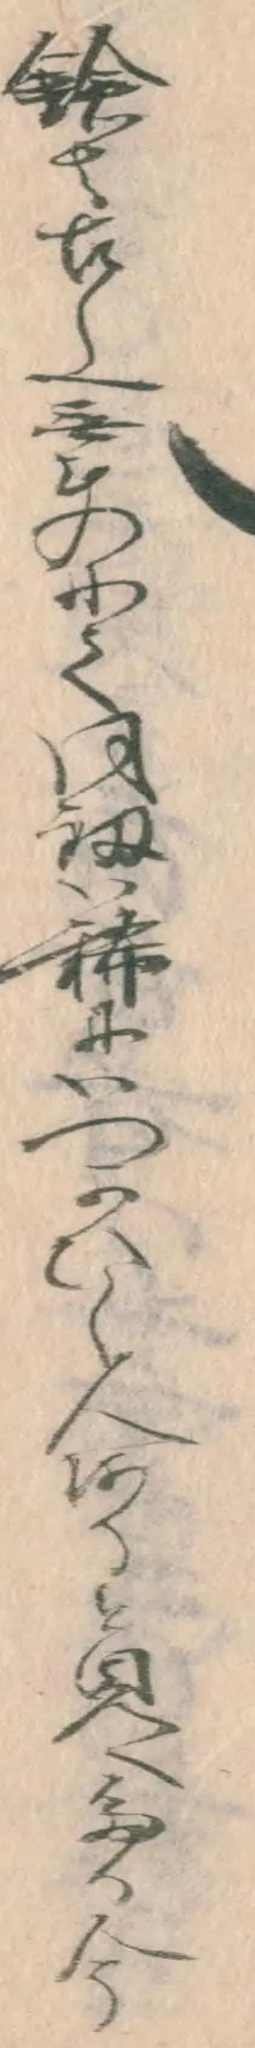鎗は古しへ無ものにて月剣は稀にはつかひし人ありと見へたり今
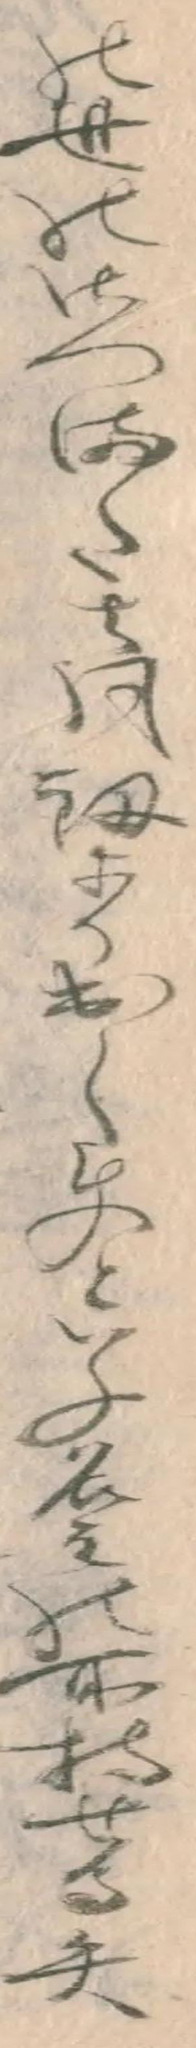の世のさつまたは月剣より出しものといふ名主の所持せる矢
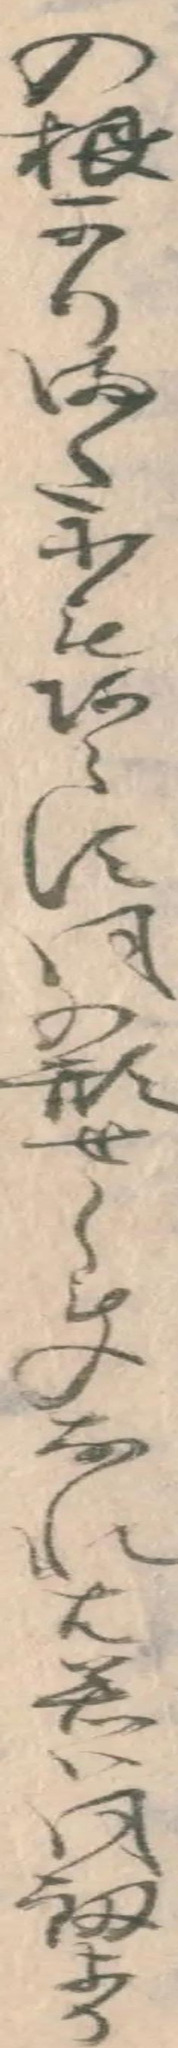の根かりまたにもあらす月の形せしものなれは若は月剣より
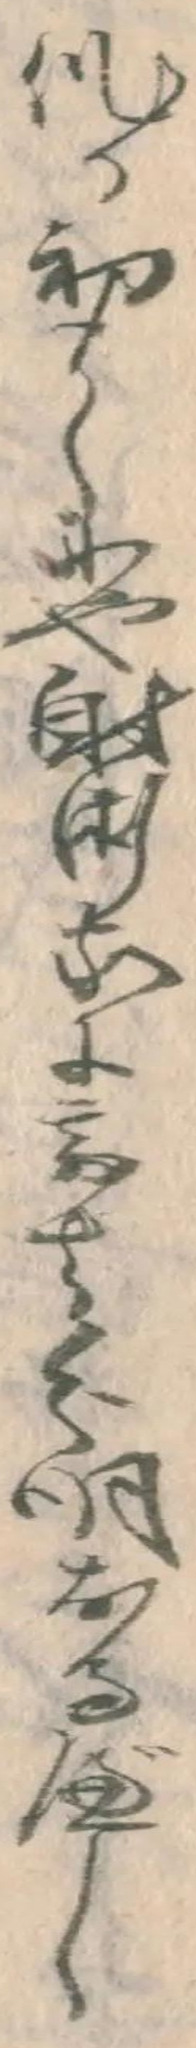作り初しにや射術家にては分明なるべし
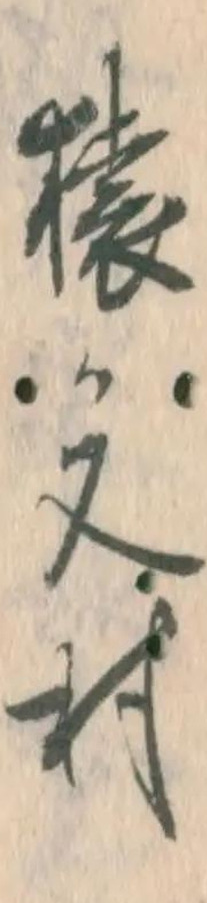猿又村
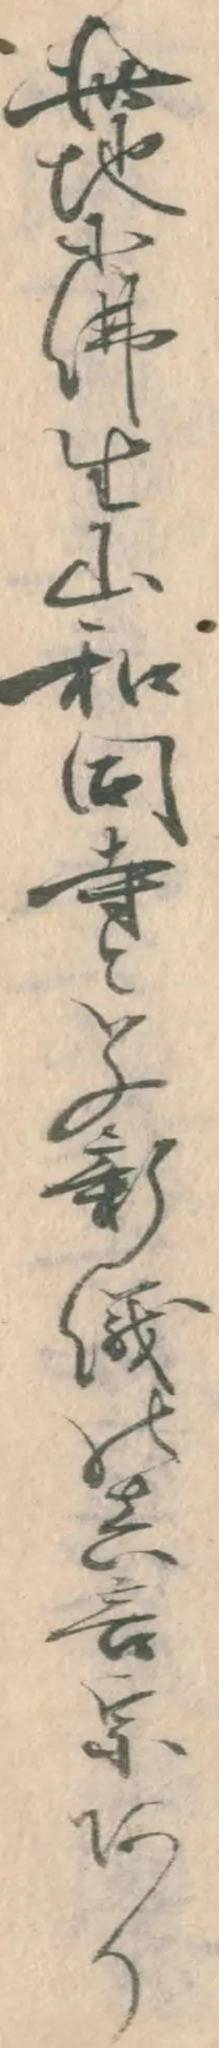此地に仏生山和同寺といふ新儀の真言宗あり

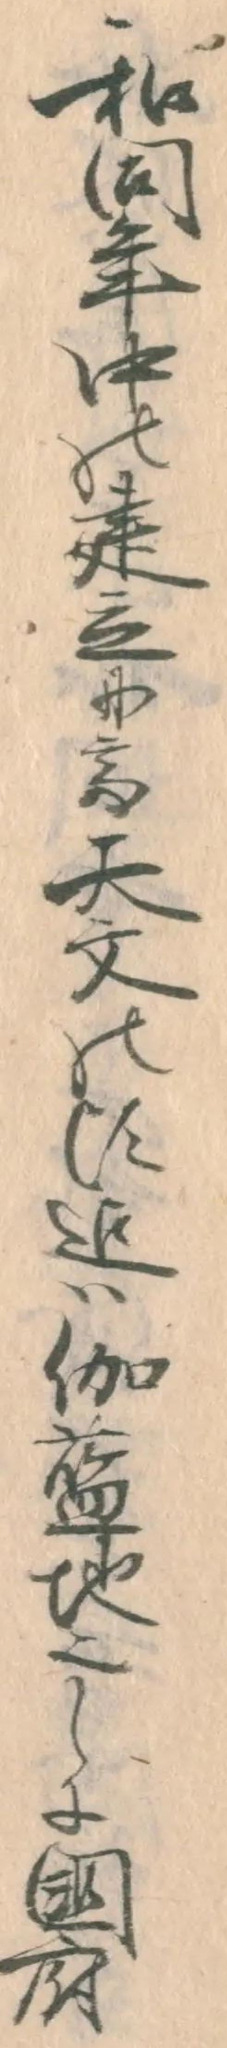和同年中の建立にて天文の頃迄は伽藍地也しに国府
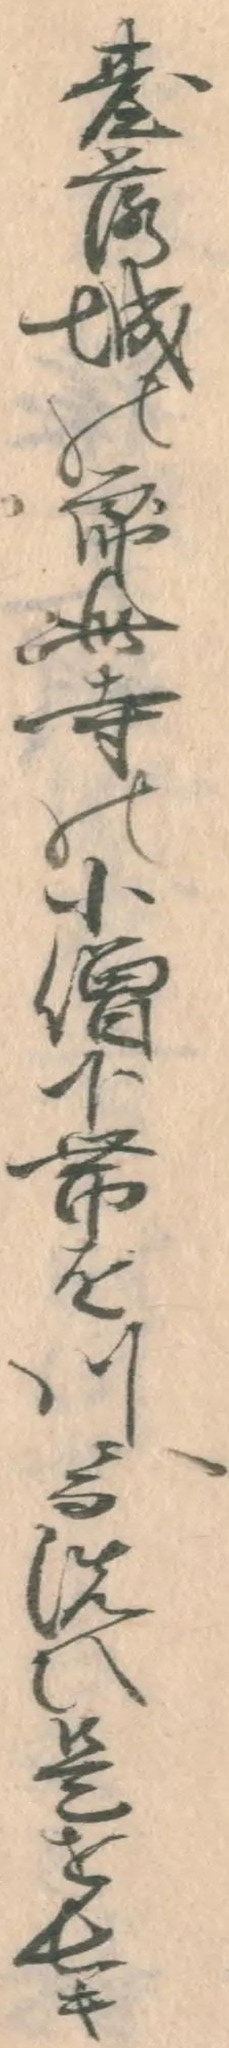台落城の節此寺の小僧下帯を川にて洗ひ是を長き
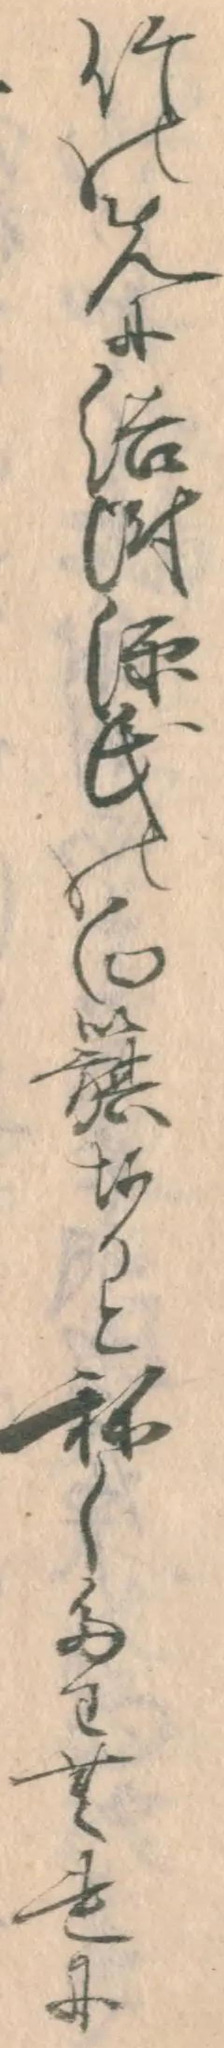竹の先に結附源氏の白籏なりと称したわむれに
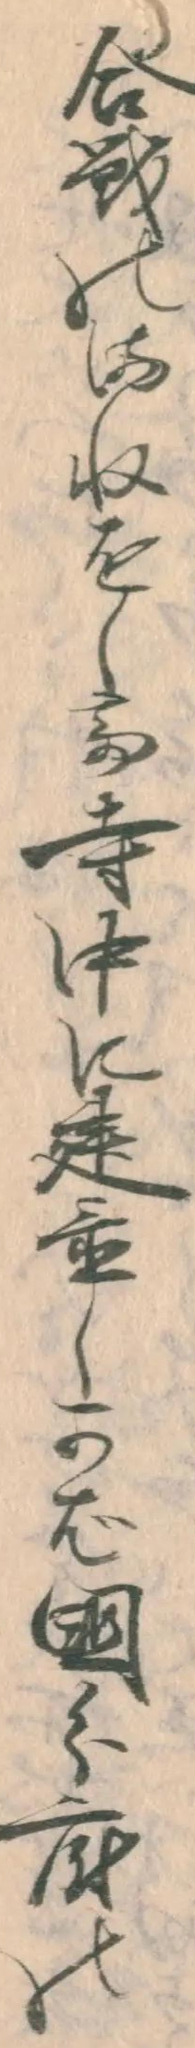合戦のまねをして寺中に建置しかば国分府の
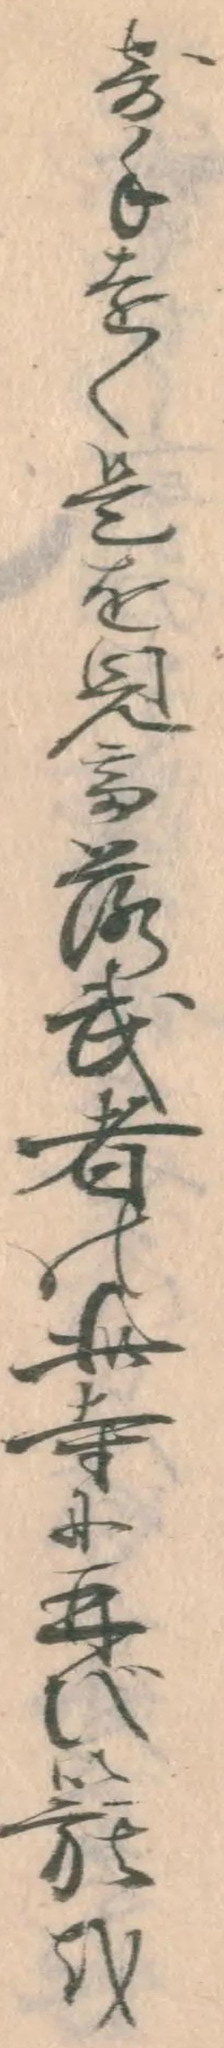寄手遠く是を見て落武者の此寺に再び御旗を
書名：四神地名録 6巻. [4]葛飾郡
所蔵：国立国会図書館 National Diet Library, JAPAN
